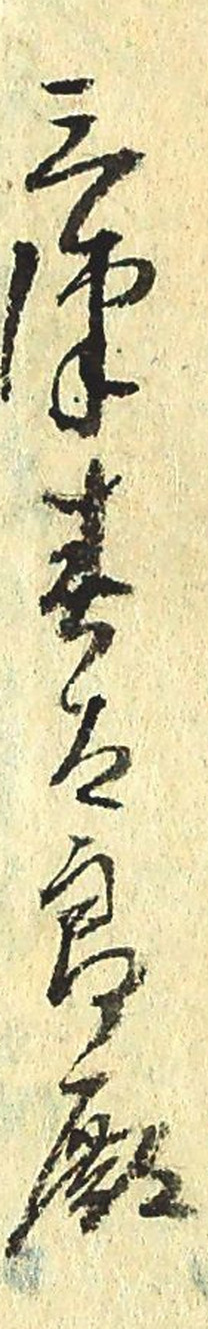三沢春太郎殿
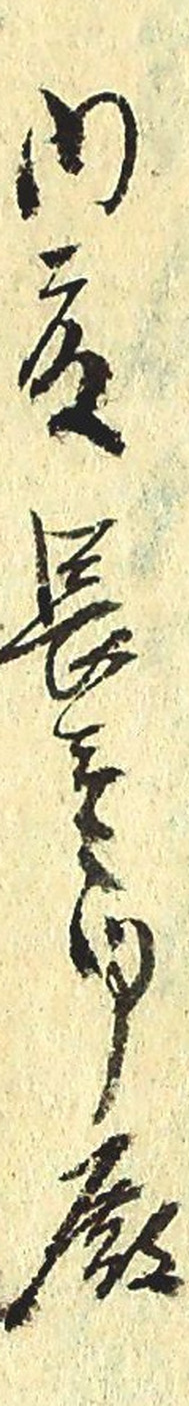内藤長三郎殿
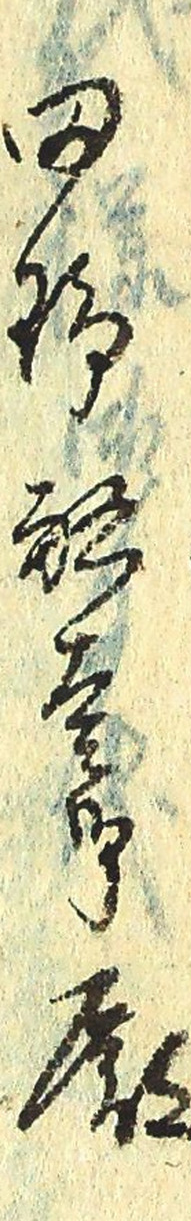田野祐太郎殿
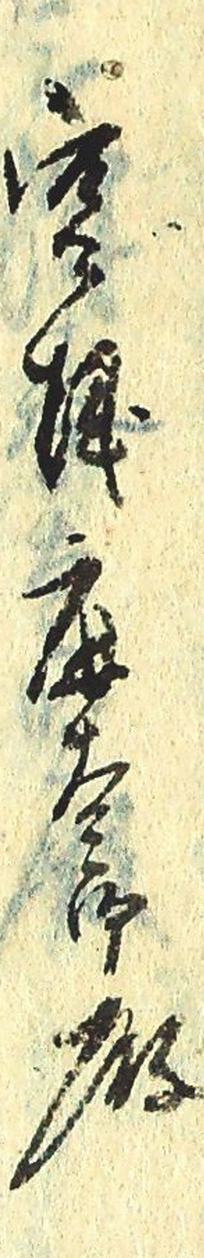宮城麻太郎殿
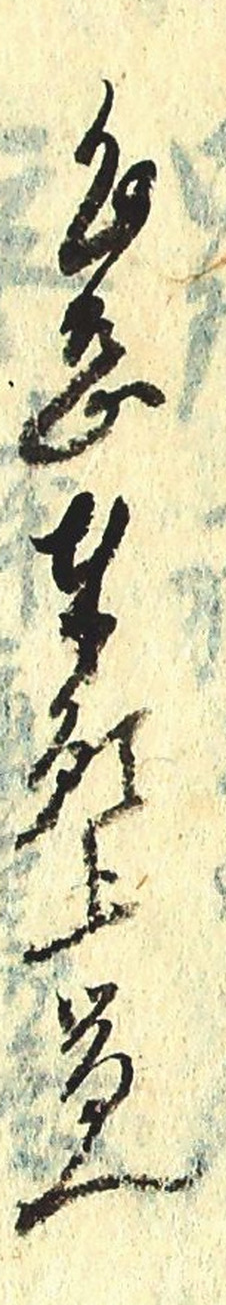乍恐奉願上覚
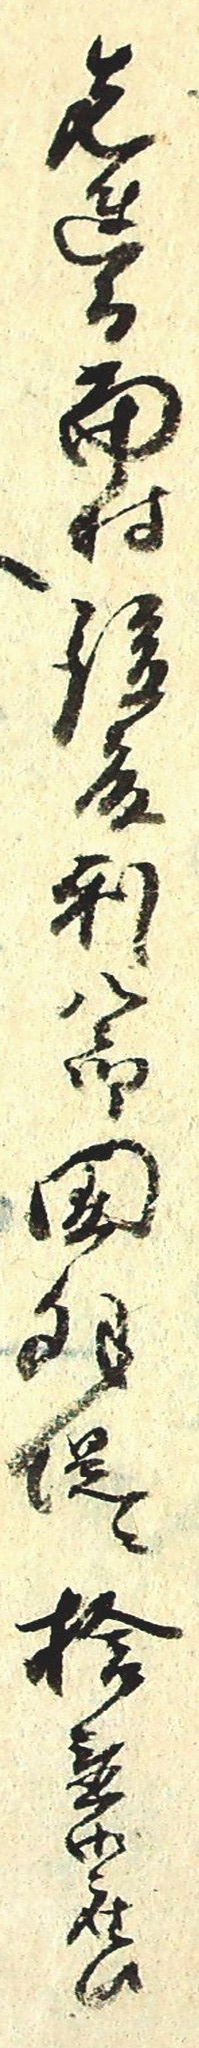先達て当村後藤利八郎囲外堤に捨置御座候
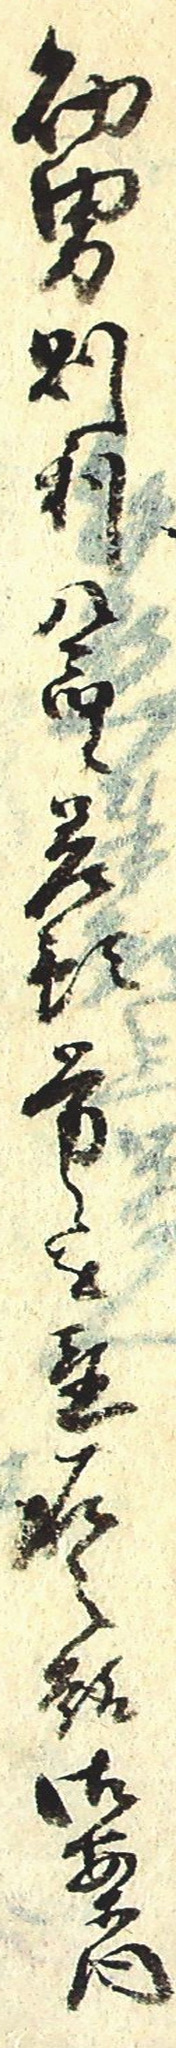幼男則利八郎へ差預け労らせ置右之趣御案内
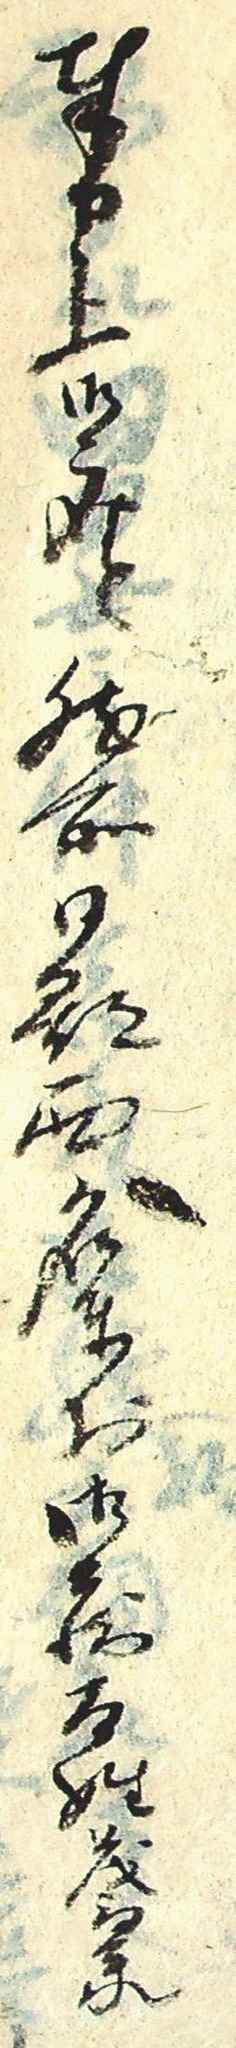奉申上御座候然所同郡西名東村御蔵百姓茂市義

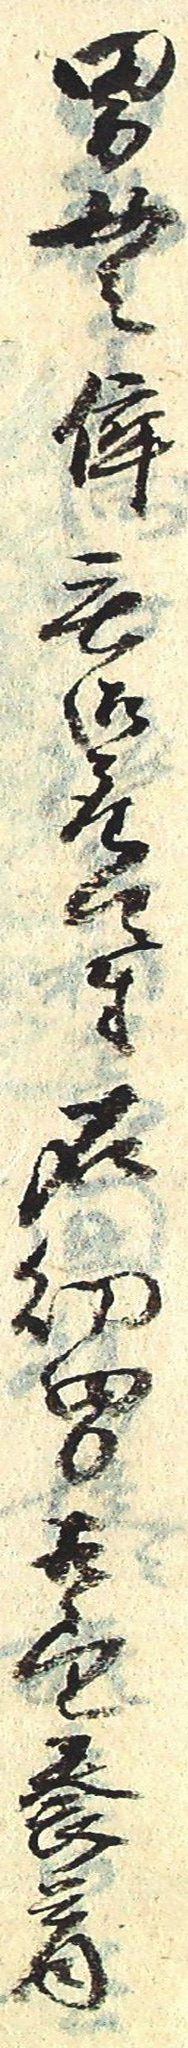男女之倅無御座候に付右幼男相望養育
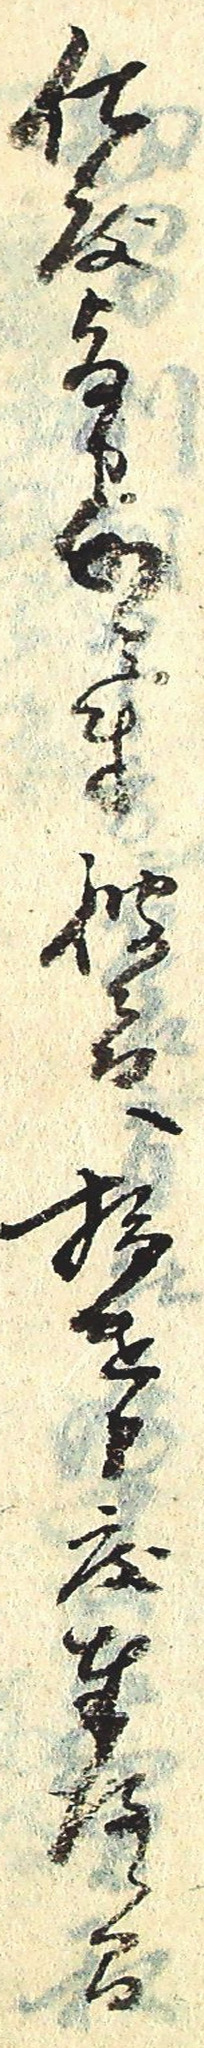仕度旨申出候に付彼者へ指遣申度奉存候間
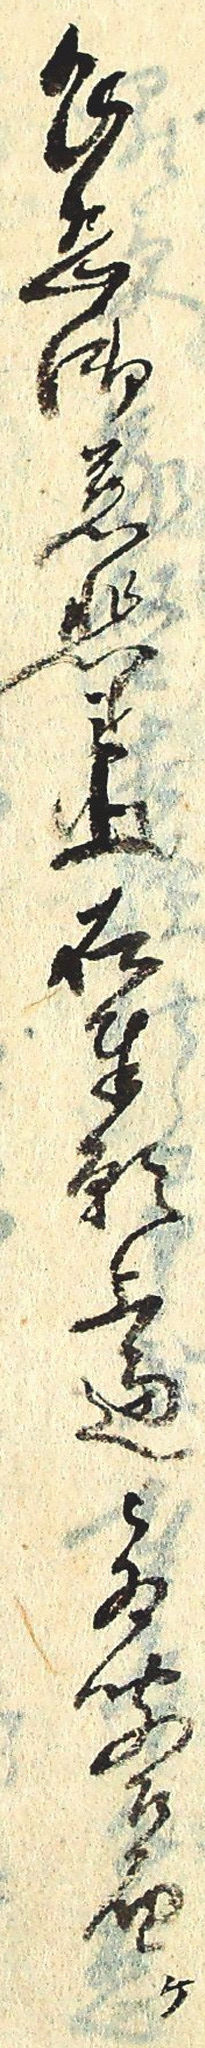乍恐御慈悲之上右奉願上通被為聞召届け
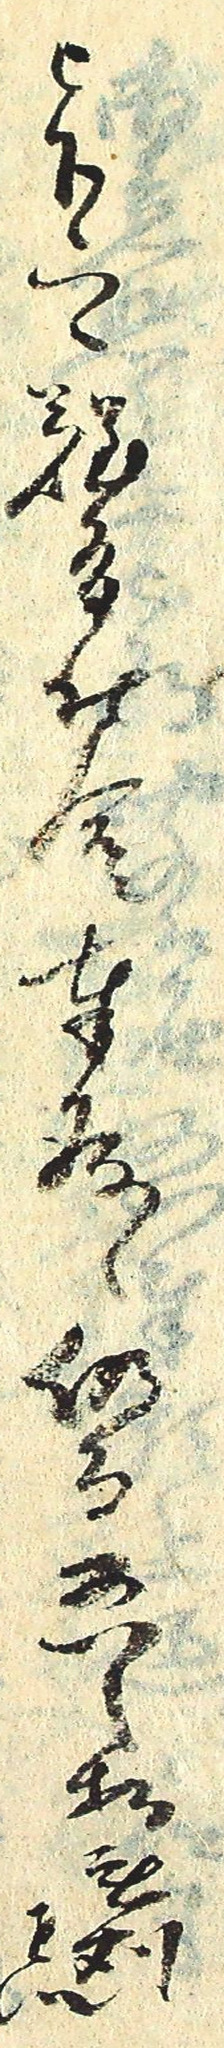被下候はゝ難有仕合に奉存候仍て右之段連判を以
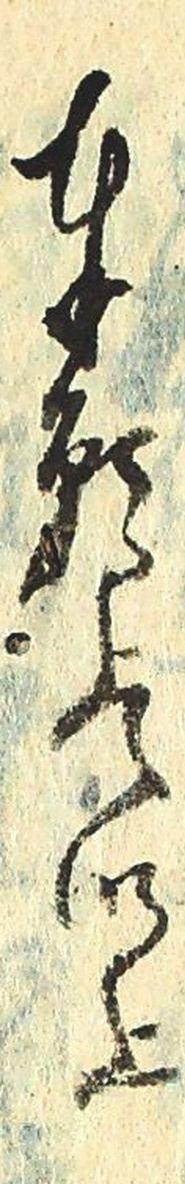奉願上候以上
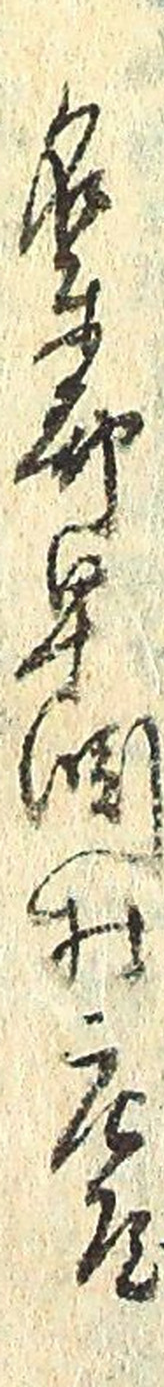名東郡早淵村庄屋
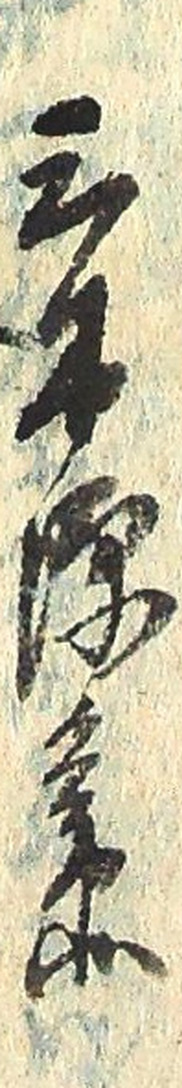三木源兵衛
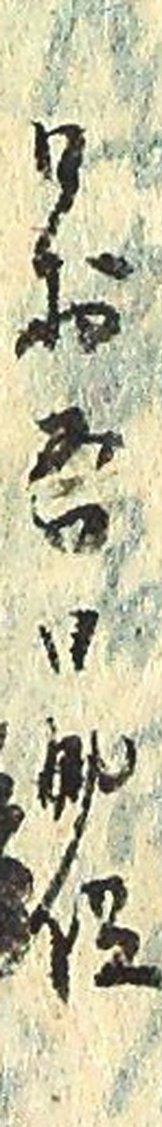同村右同助役
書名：諸御願書控(弐番）
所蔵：鳴門教育大学 Naruto University of Education
